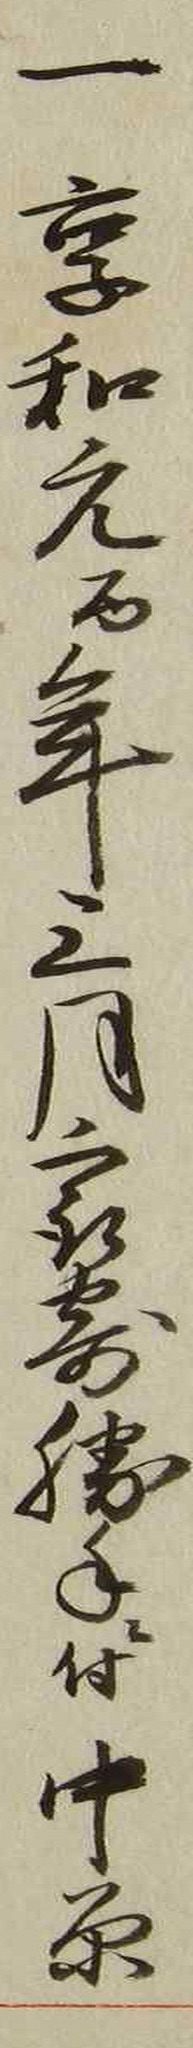一享和元酉年三月最寄勝手ニ付中原
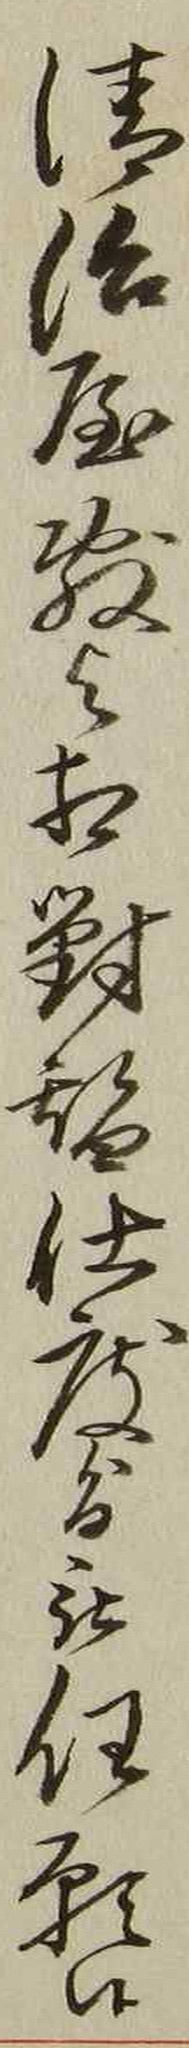清治屋敷と相対替仕度旨被任願候
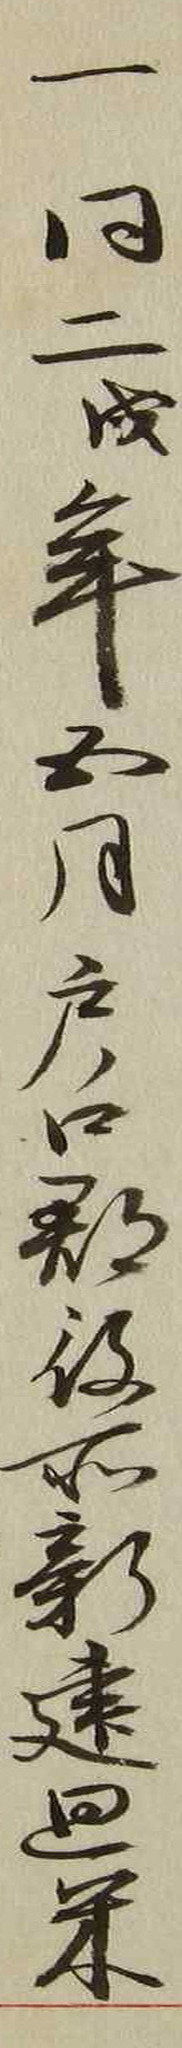一同二戌年五月戸ノ口郡役所新建廻米
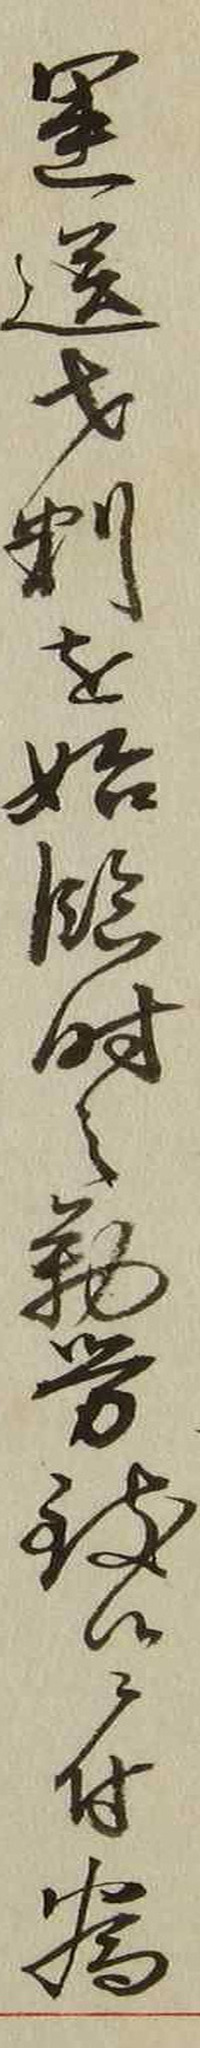運送才判を始臨時之勤労致候ニ付為
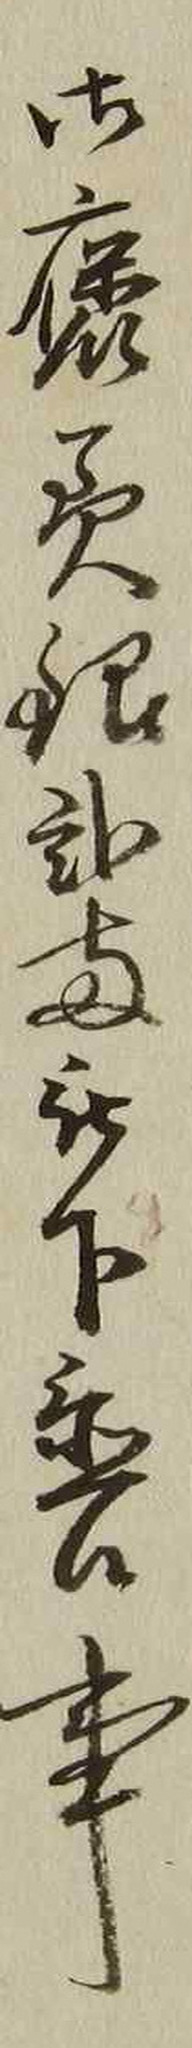御褒美銀弐両被下置候事
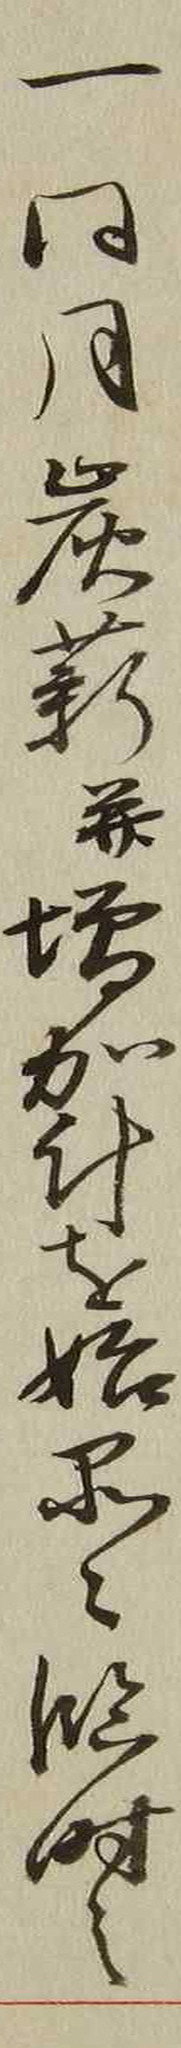一同月炭薪并増加取計を始品々臨時之
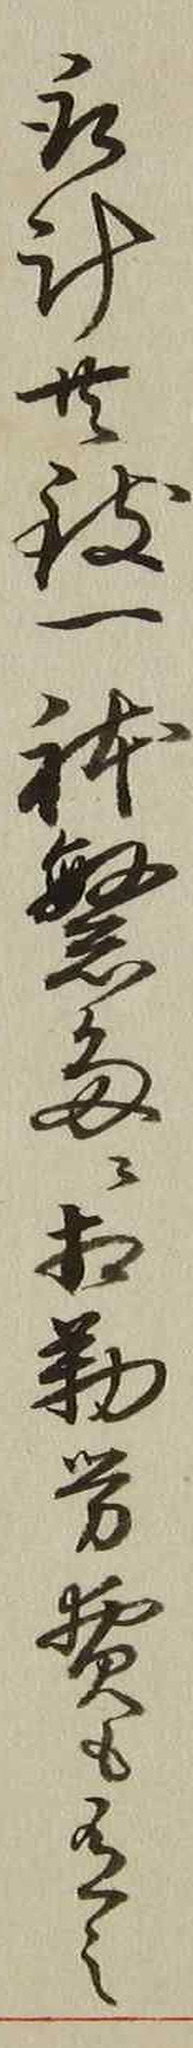取計共致一体繁多ニ相勤労費も有之
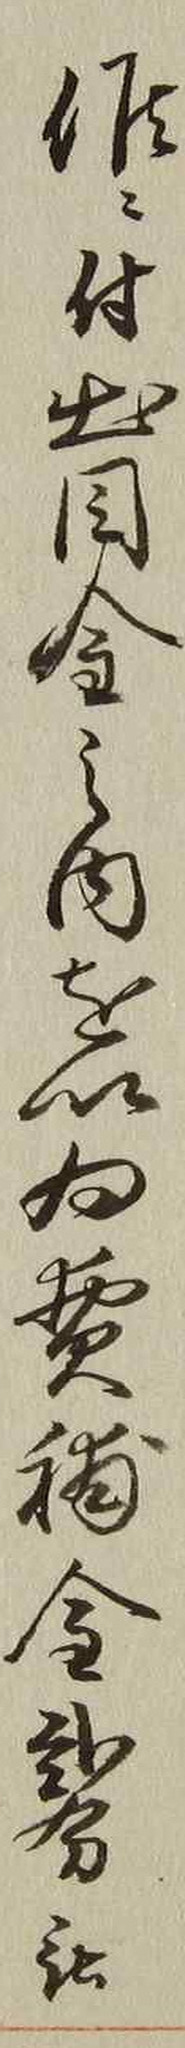候ニ付出目金之内を以為費補金弐分被
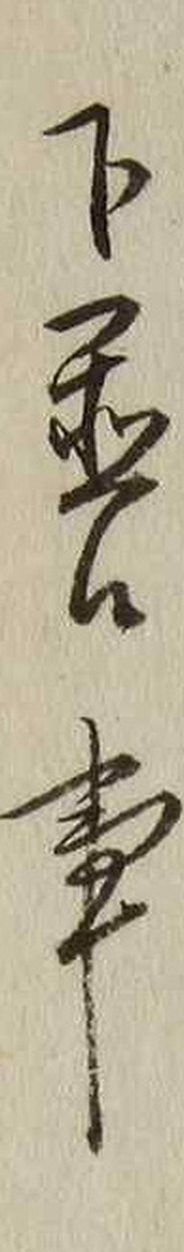下置候事
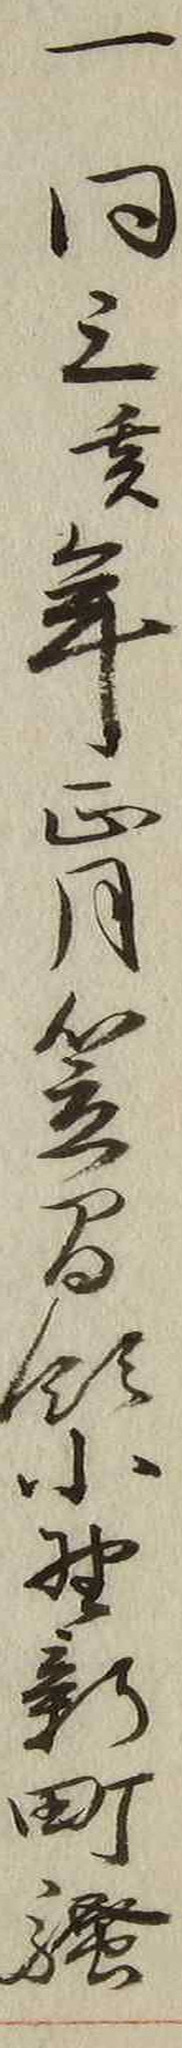一同三亥年正月笠間領小野新町騒
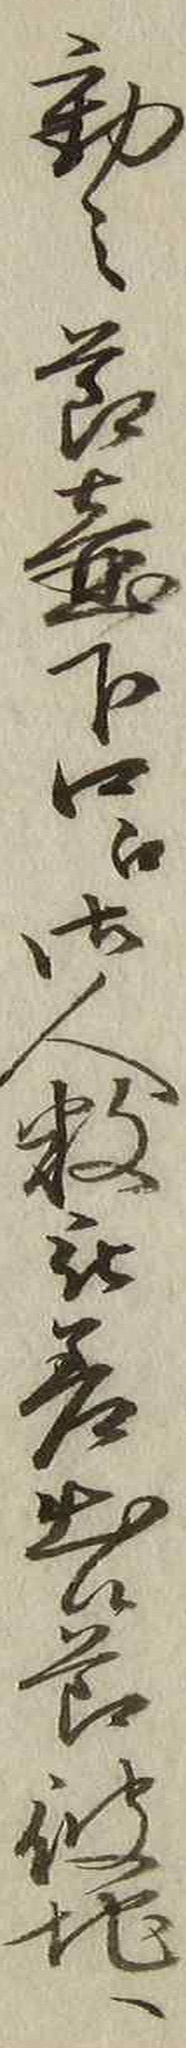動之節壷下口江御人数被差出候節彼地へ
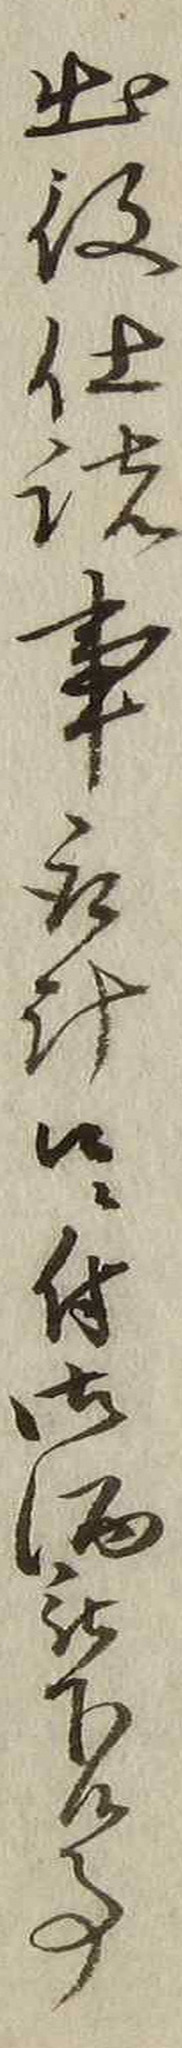出役仕諸事取計候ニ付御酒被下候事
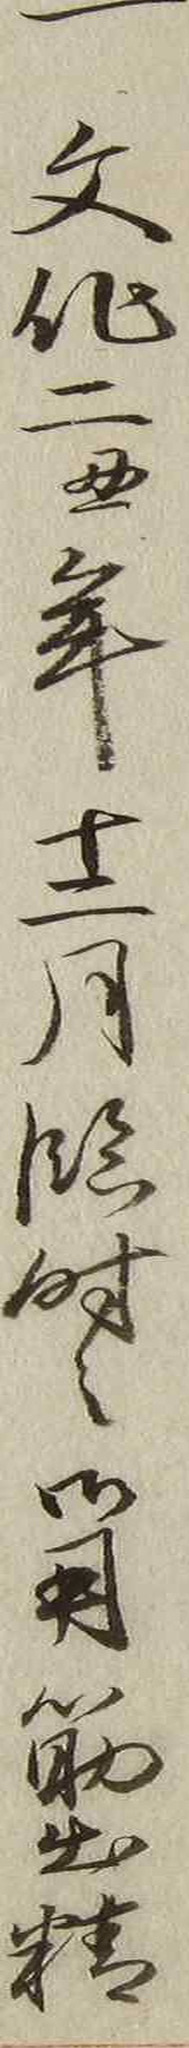一文化二丑年十二月臨時之御用筋出精
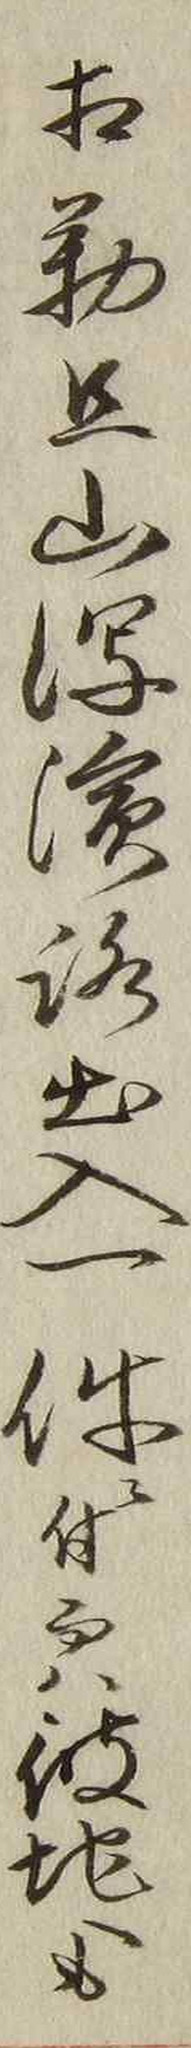相勤且山潟浜路出入一件ニ付而ハ彼地へも
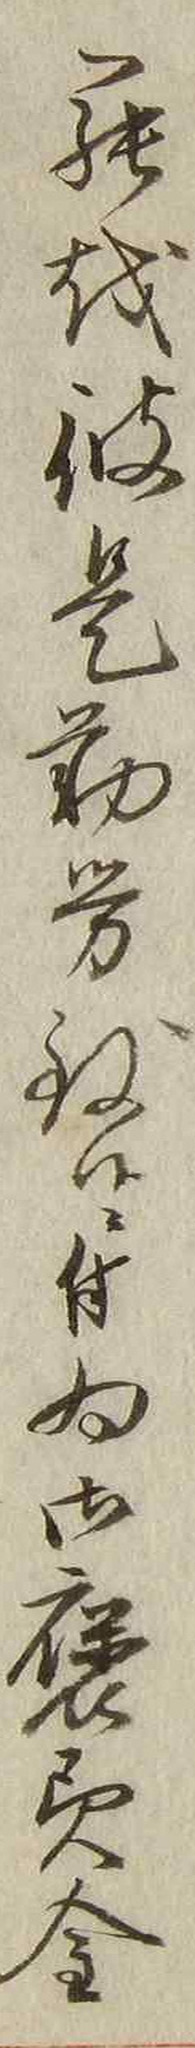罷越彼是勤労致候ニ付為御褒美金
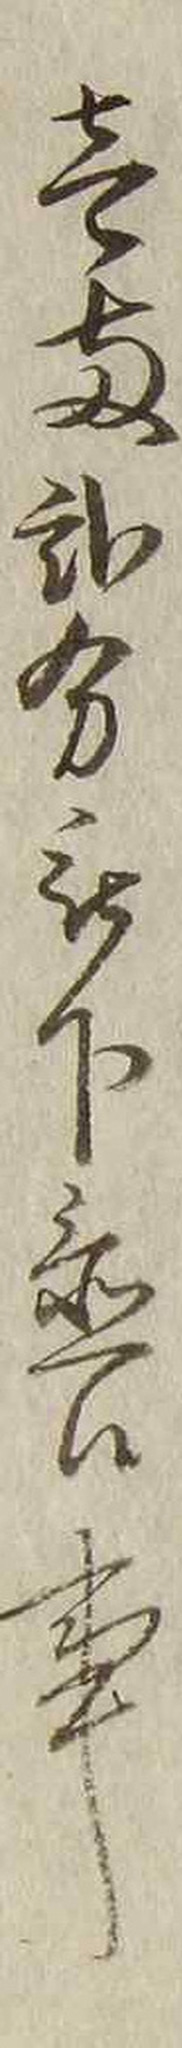壱両弐分被下置候事
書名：諸士系譜　巻之102　か之部10
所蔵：会津若松市立会津図書館
